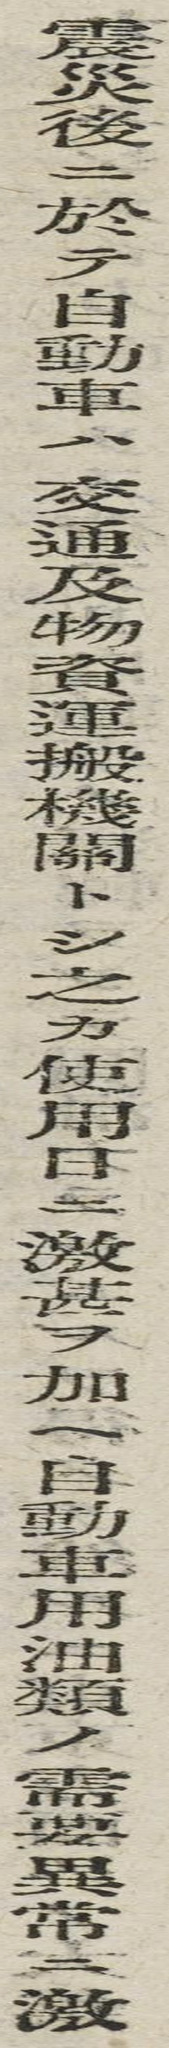震災後ニ於テ自動車ハ交通及物資運搬機関トシ之カ使用日ニ激甚ヲ加ヘ自動車用油類ノ需要異常ニ激
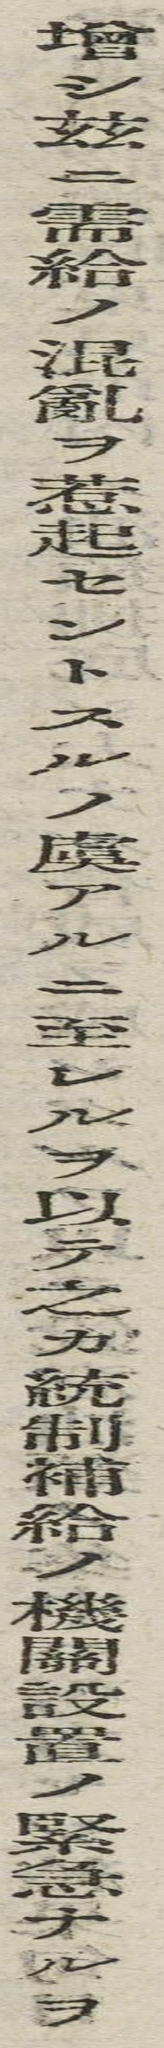増シ茲ニ需給ノ混乱ヲ惹起セントスルノ虞アルニ至レルヲ以テ之カ統制補給ノ機関設置ノ緊急ナルヲ
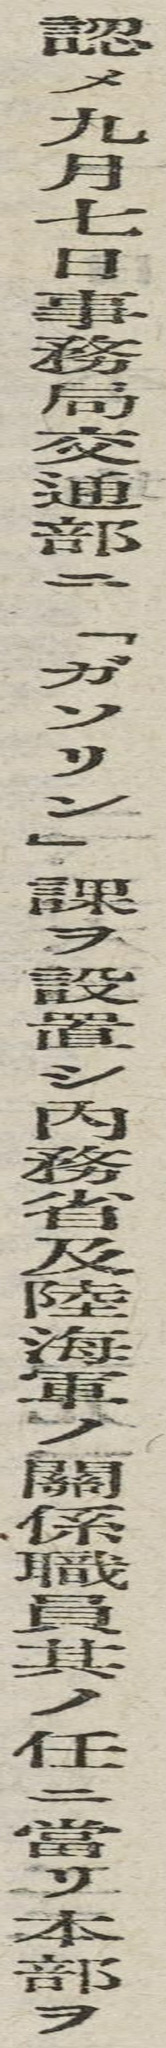認メ九月七日事務局交通部ニ「ガソリン」課ヲ設置シ内務省及陸海軍ノ関係職員其ノ任ニ当リ本部ヲ
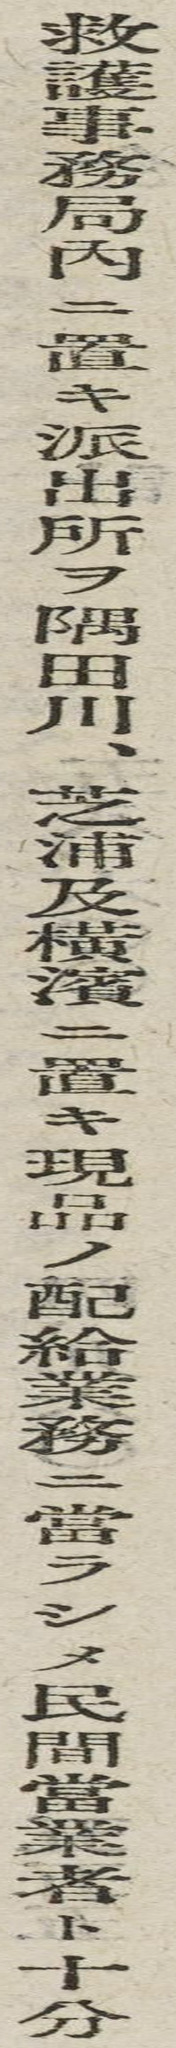救護事務局内ニ置キ派出所ヲ隅田川、芝浦及横浜ニ置キ現品ノ配給業務ニ当ラシメ民間当業者ト十分
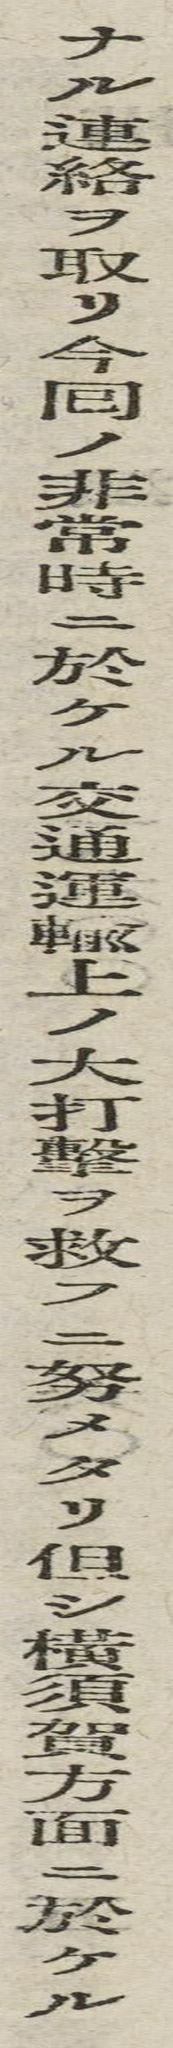ナル連絡ヲ取リ今回ノ非常時ニ於ケル交通運輸上ノ大打撃ヲ救フニ努メタリ但シ横須賀方面ニ於ケル
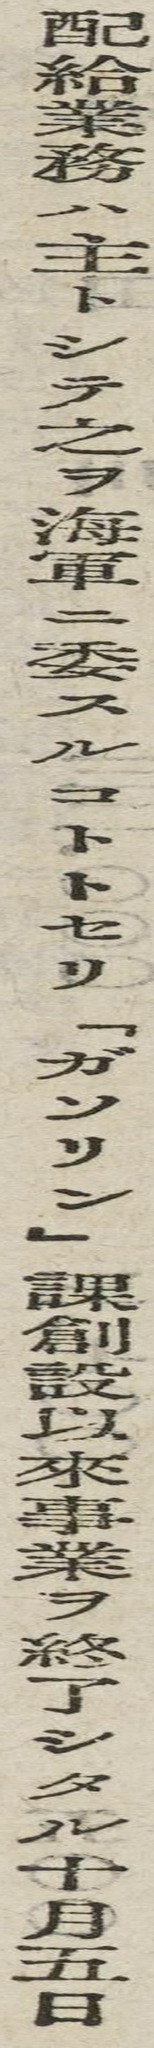配給業務ハ主トシテ之ヲ海軍ニ委スルコトトセリ「ガソリン」課創設以来事業ヲ終了シタル十月五日
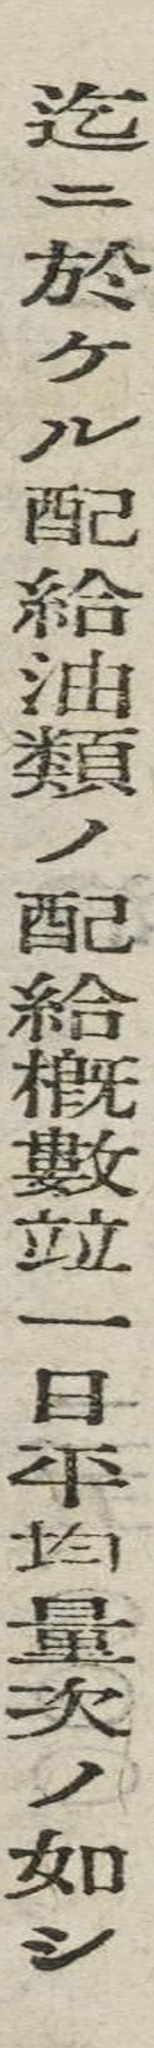迄ニ於ケル配給油類ノ配給概数並一日平均量次ノ如シ

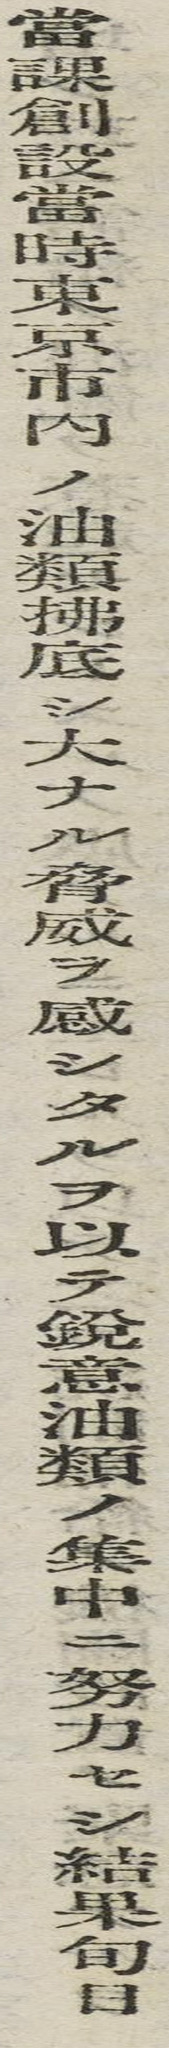当課創設当時東京市内ノ油類払底シ大ナル脅威ヲ感シタルヲ以テ鋭意油類ノ集中ニ努力セシ結果旬日
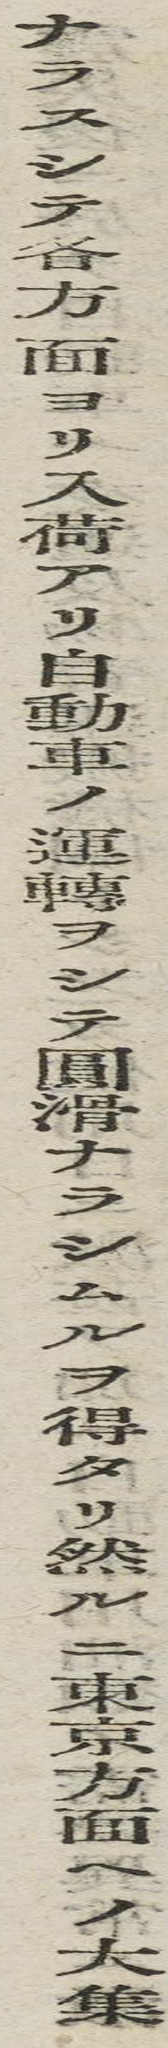ナラスシテ各方面ヨリ入荷アリ自動車ノ運転ヲシテ円滑ナラシムルヲ得タリ然ルニ東京方面ヘノ大集
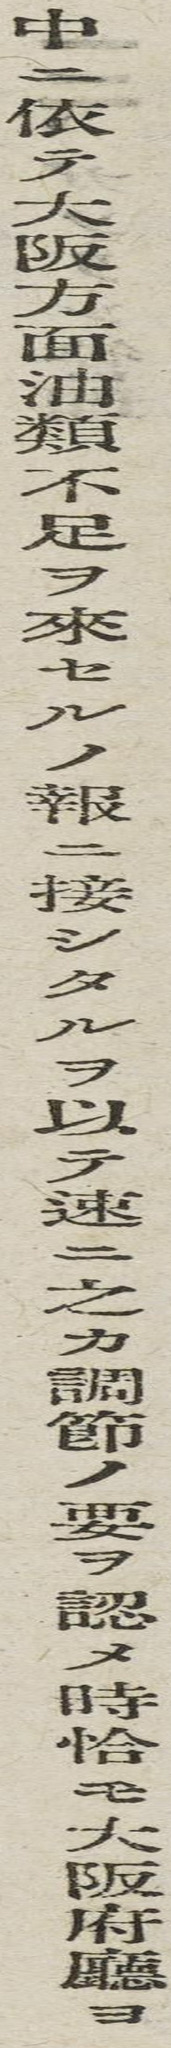中ニ依テ大阪方面油類不足ヲ来セルノ報ニ接シタルヲ以テ速ニ之カ調節ノ要ヲ認メ時恰モ大坂府庁ヨ
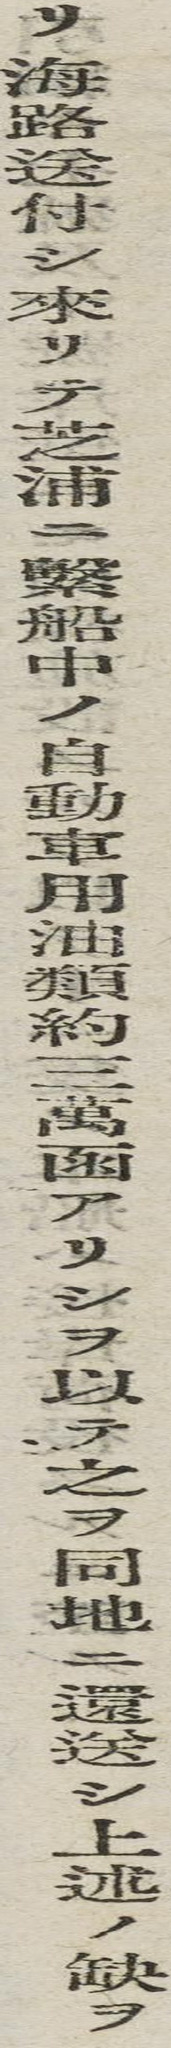リ海路送付シ来リテ芝浦ニ繋船中ノ自動車用油類約三万函アリシヲ以テ之ヲ同地ニ還送シ上述ノ欠ヲ
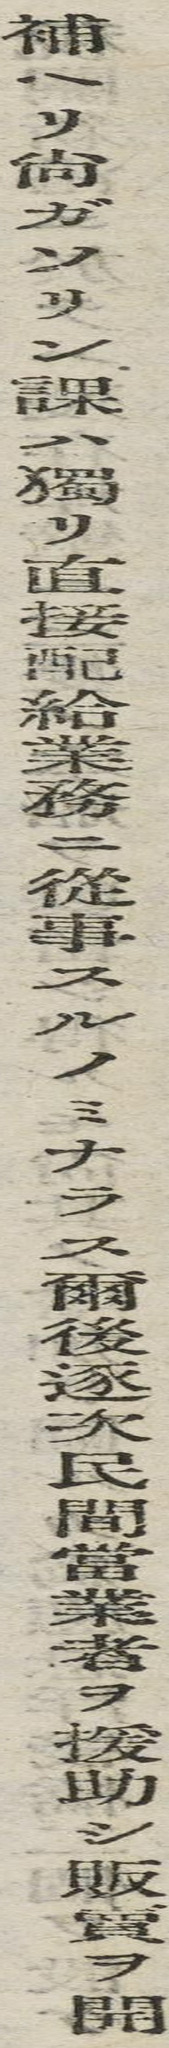補ヘリ尚ガソリン課ハ独リ直接配給業務ニ従事スルノミナラス爾後逐次民間当業者ヲ援助シ販売ヲ開
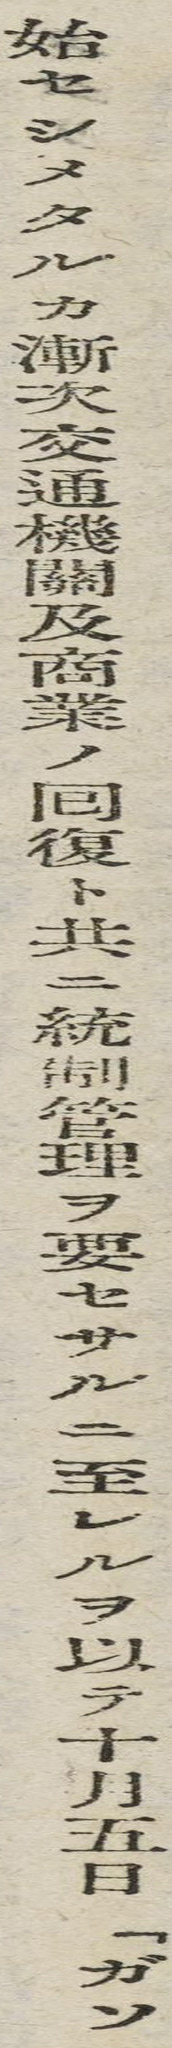始セシメタルカ漸次交通機関及商業ノ回復ト共ニ統制管理ヲ要セサルニ至レルヲ以テ十月五日「ガソ
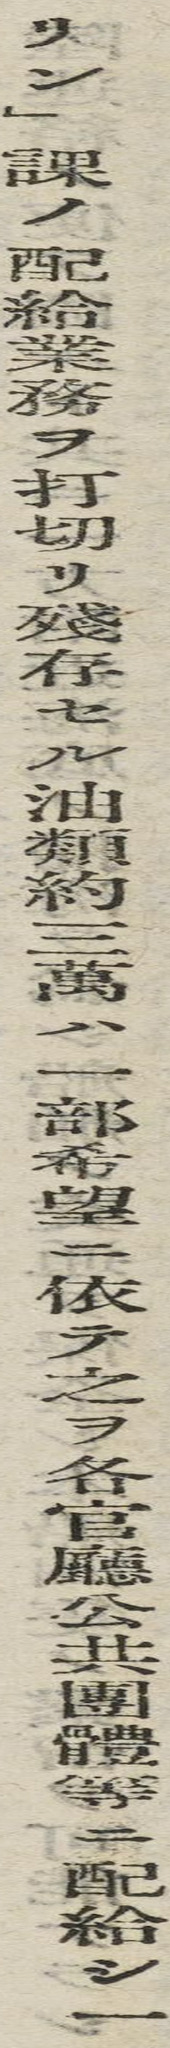リン」課ノ配給業務ヲ打切リ残存セル油類約三万ハ一部希望ニ依テ之ヲ各官庁公共団体等ニ配給シ一
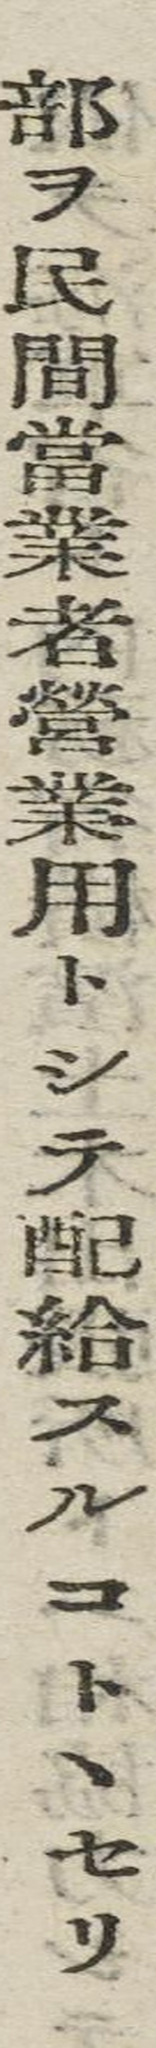部ヲ民間当業者営業用トシテ配給スルコトヽセリ
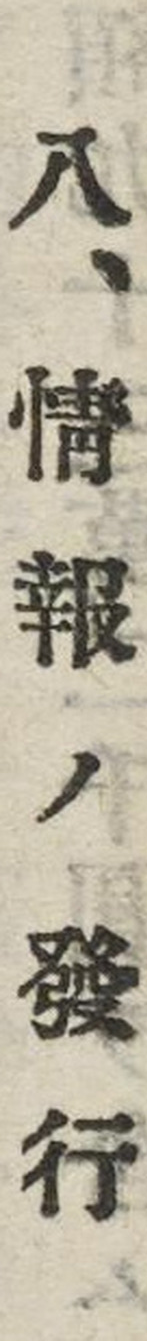八、情報ノ発行
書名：震災被害状況並救護施設概要
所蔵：東京大学地震研究所図書室 Earthquake Research Institute Library, The University of Tokyo, JAPAN
